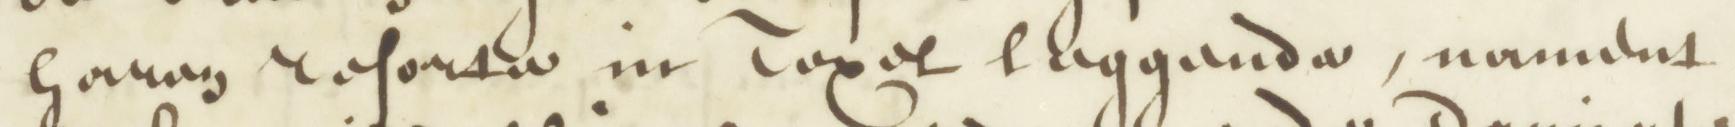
haeren resorte in Texel leggende, nament„
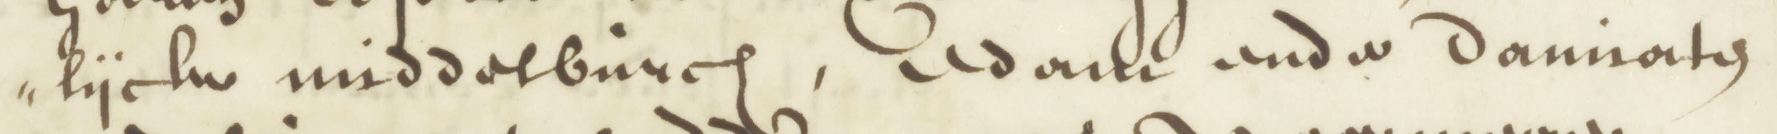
,,lijck Middelburch, Edam, ende Damiaten
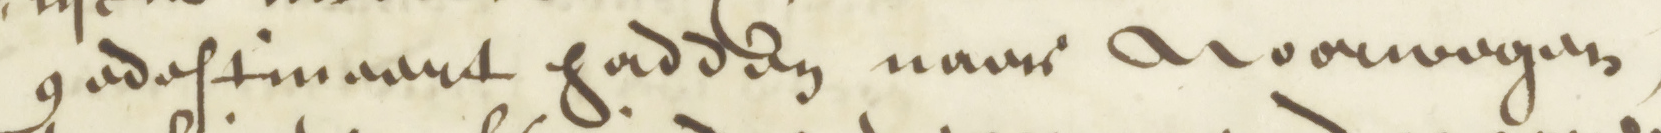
gedestineert hadden naar Noorwegen,
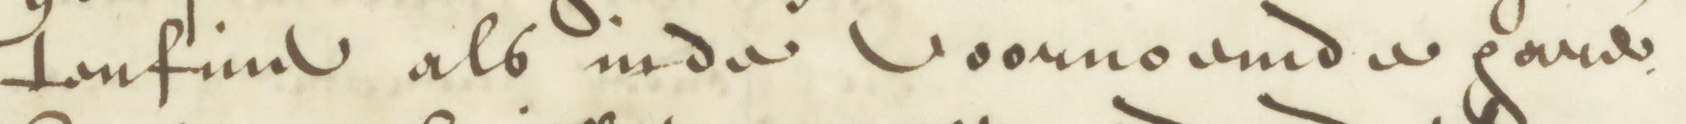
ten fine als in de voornoemde hare
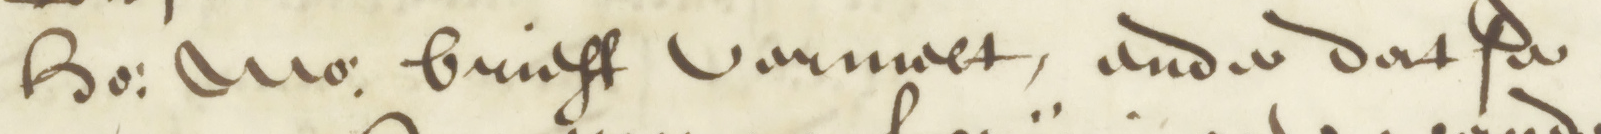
Ho: Mo: brieff vermelt, ande dat se
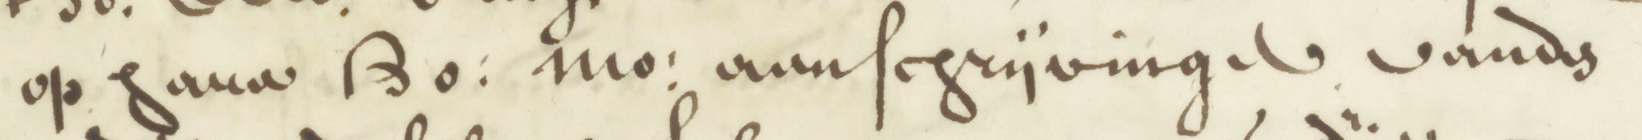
op hare Ho: Mo: aenschrijvinge vanden
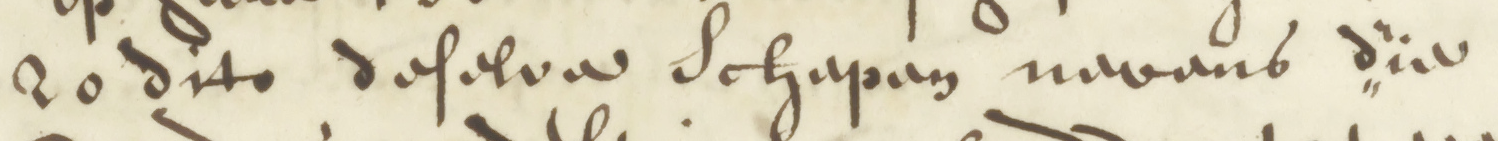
20 dito deselve schepen nevens die
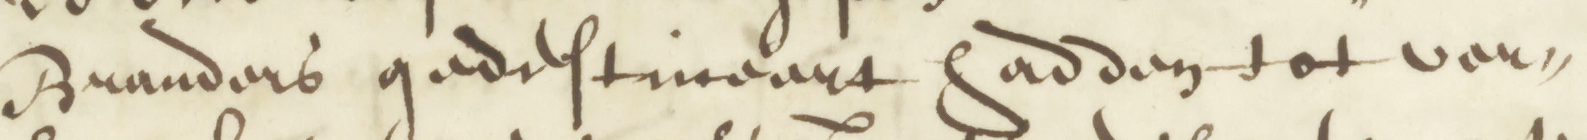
branders gedestineert haadden tot ver„
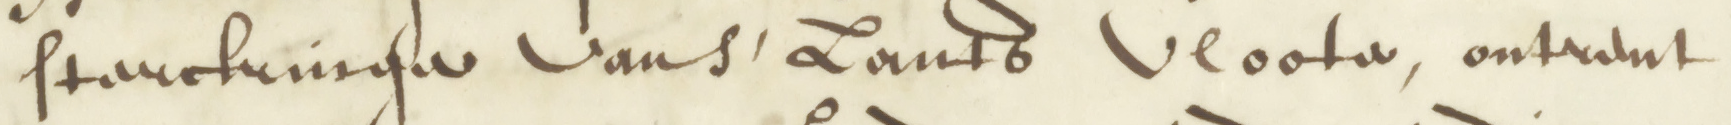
sterckinge van s'Lants vloote, ontrent
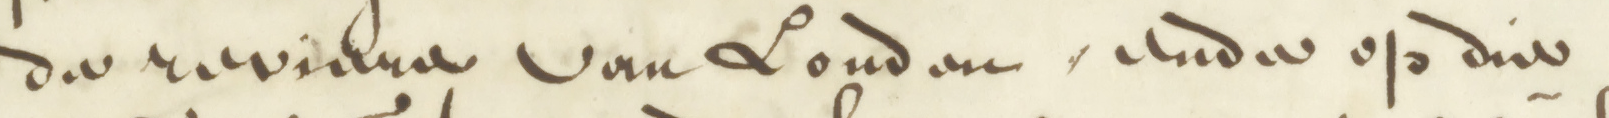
de reviere van Londen, ende op die
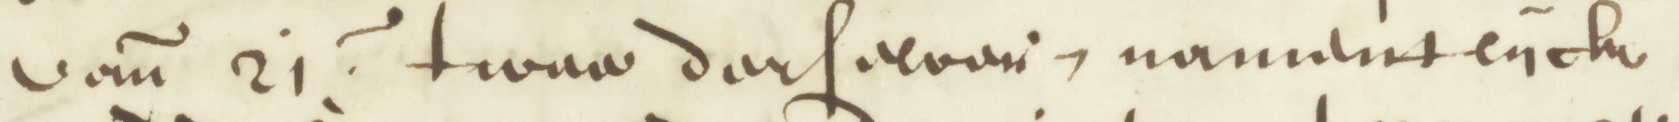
van 21e twee derselver, namentlijck
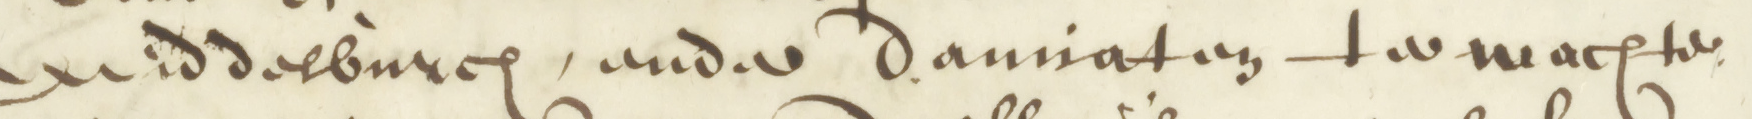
Middelburch, ende Damiaten te wachte
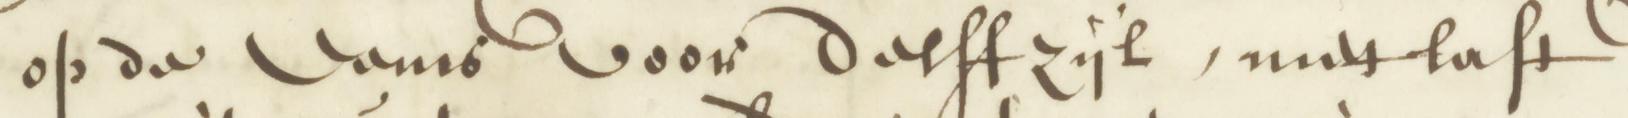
op de Eems voor Delffzijl, met last
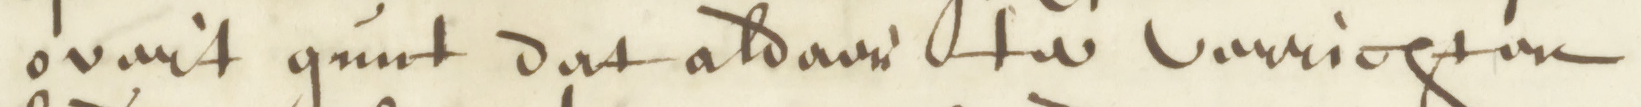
over 't gunt dat aldaer te verrichten
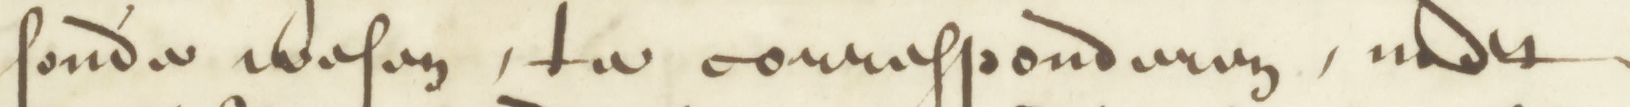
soude wesen, te corresponderen, met
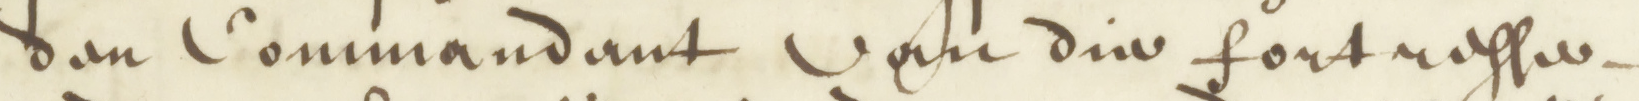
den Commandant van die fortresse
